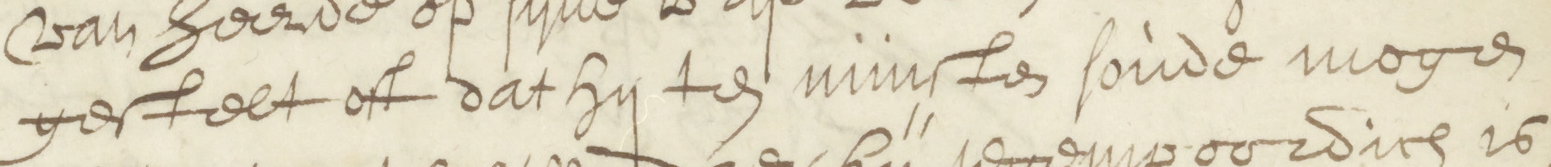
gestelt off dat hy ten minsten soude mogen
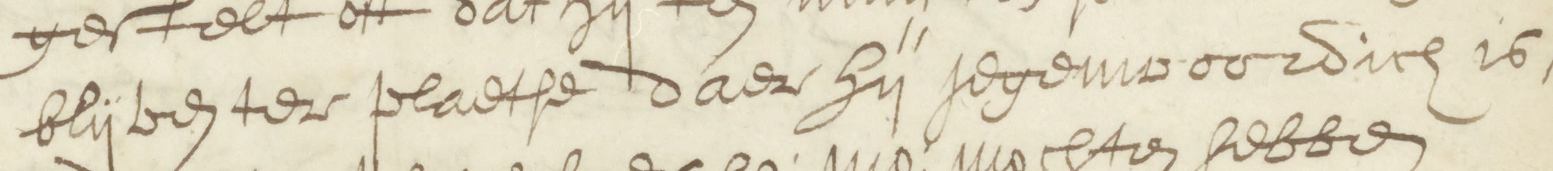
blijven ter plaetse daer hij jegenwoordich is
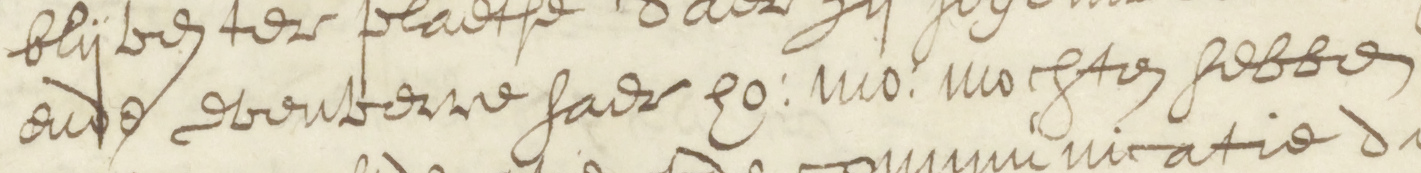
ende evenverre haer ho:mo: mochten hebben
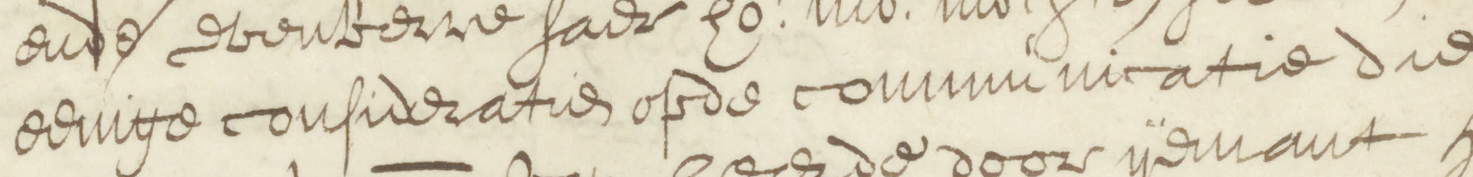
eenige consideratien opde communicatie die
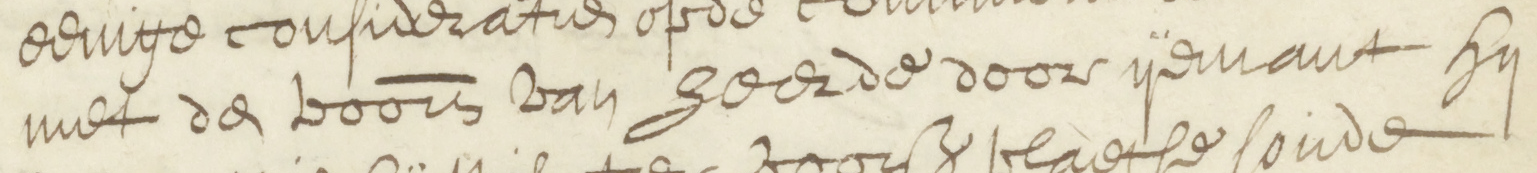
met den voorn van heerde door ijemant hy
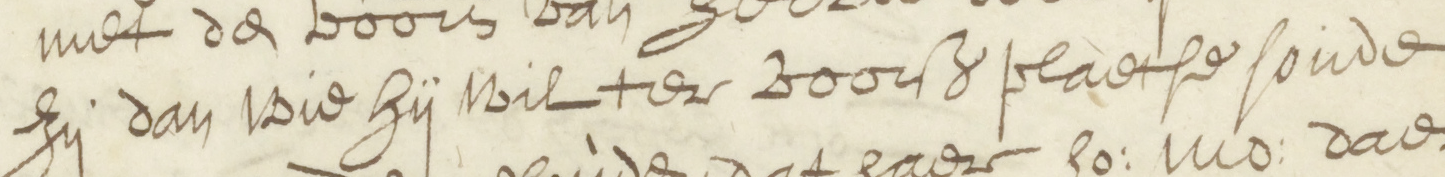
zij dan wie hij wil ter voors plaetse soude
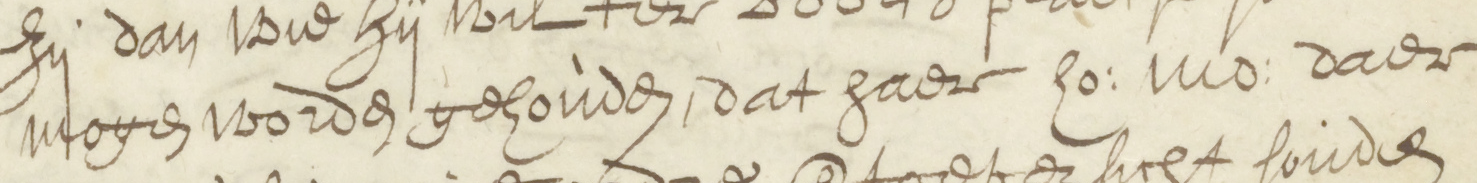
mogen worden gehouden, dat haer ho:Mo: daer
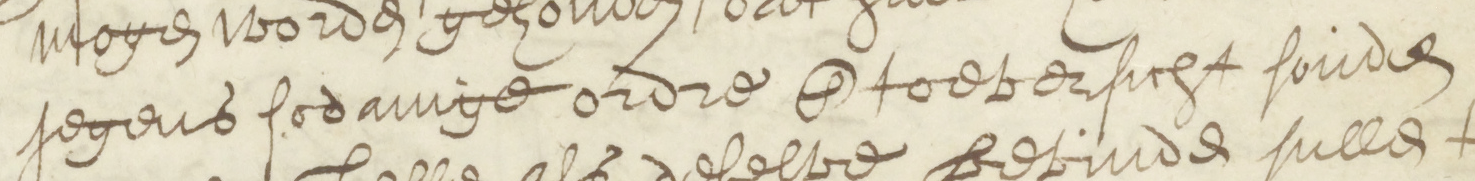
jegens sodanige ordre & toeversicht souden
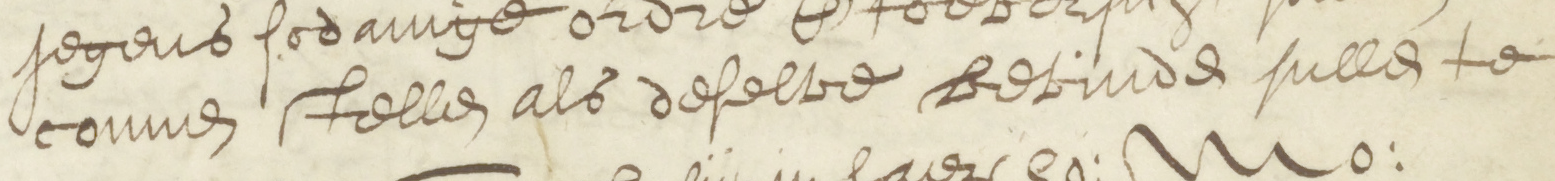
connen stellen als deselve bevinden sullen te
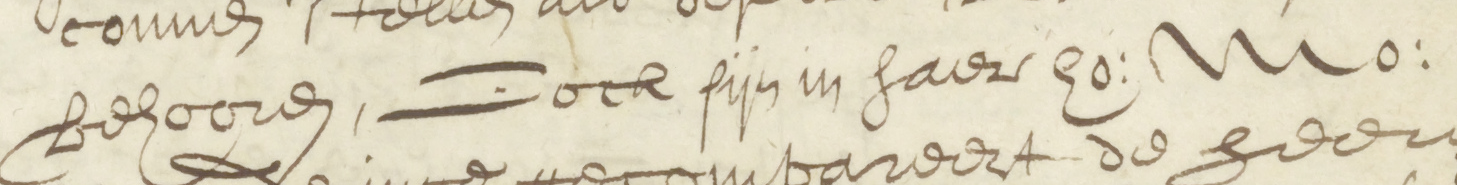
behooren. Oock sijn in haer ho:Mo:
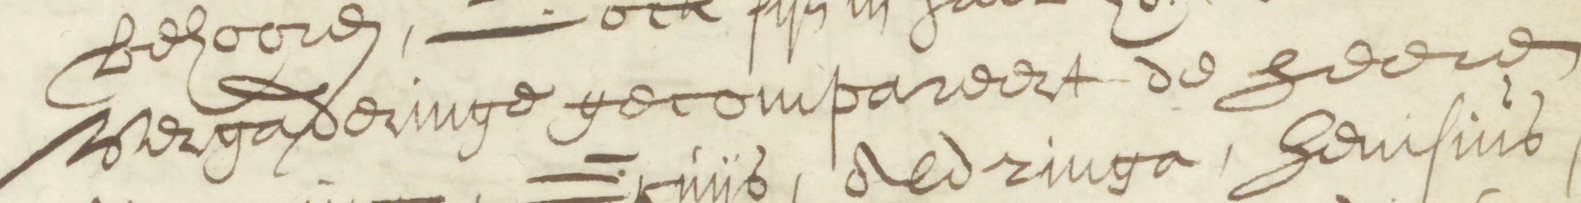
Vergaderinge gecompareert de heere
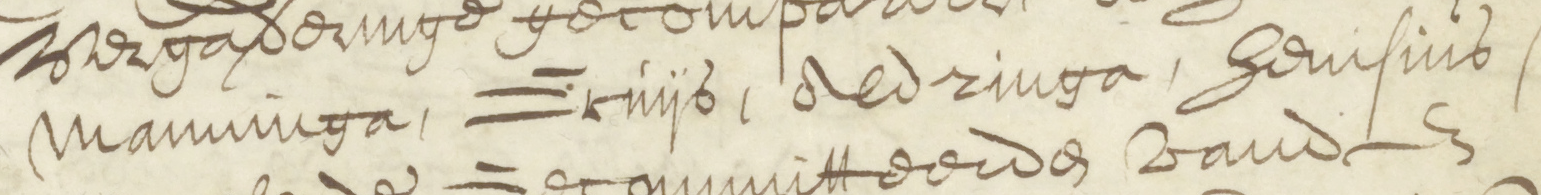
Manninga, Gruijs, Aldringa, Henisius,
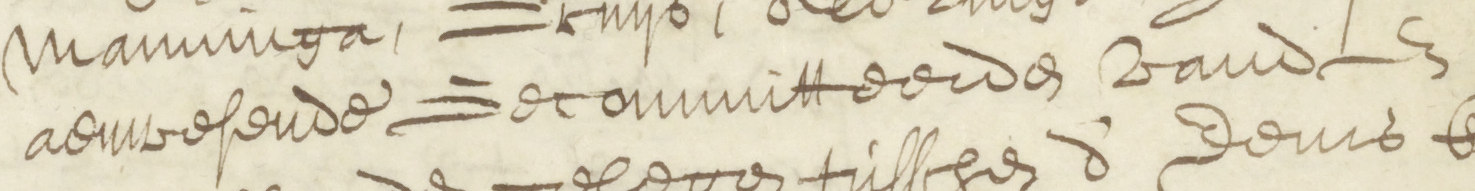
aenwesende Gecommitteerden vanden
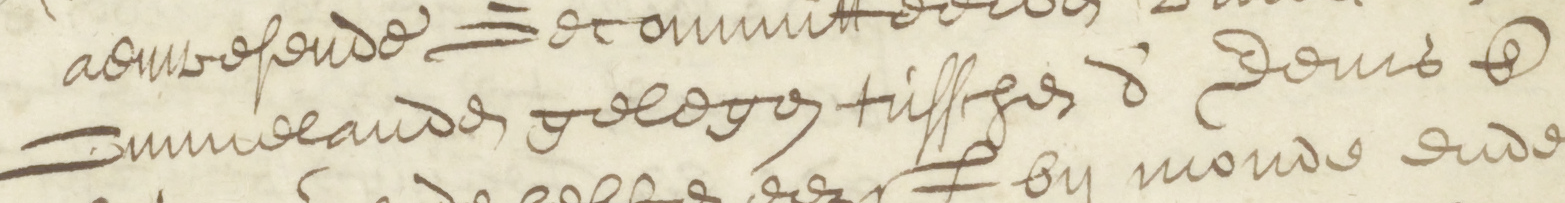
Ommelanden gelegen tusschen d' Eems &
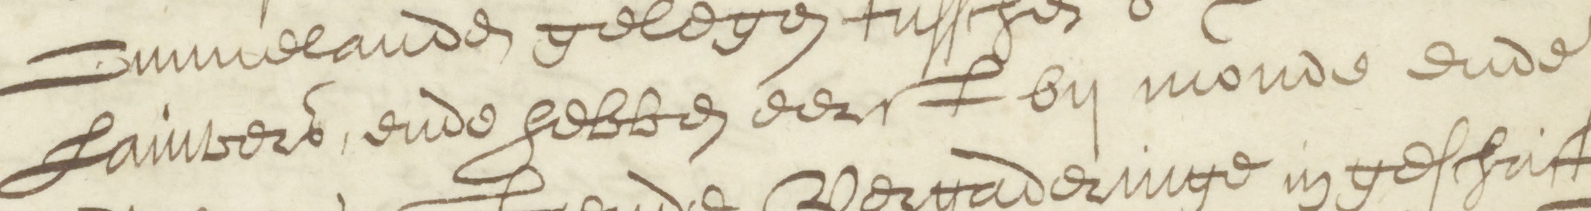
Lauwers, ende hebben eerst by monde ende
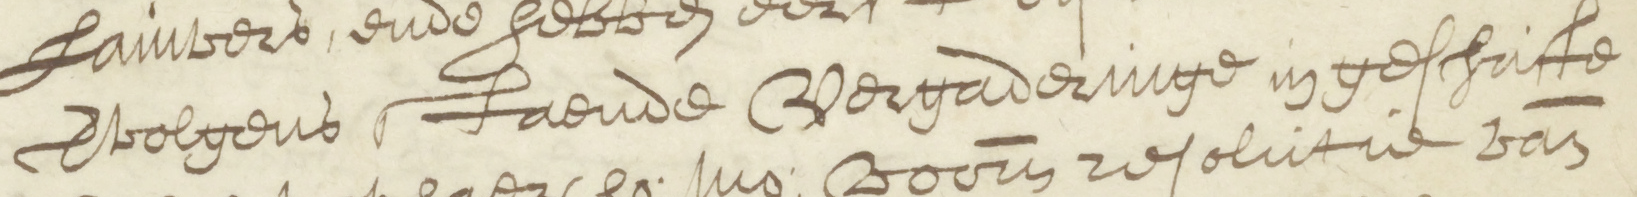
vvolgens staende Vergaderinge in geschrifte
